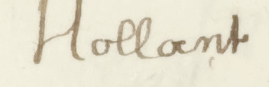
Hollant
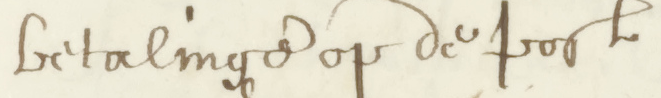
betalinge op de post
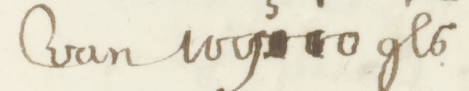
van 109000 gls.
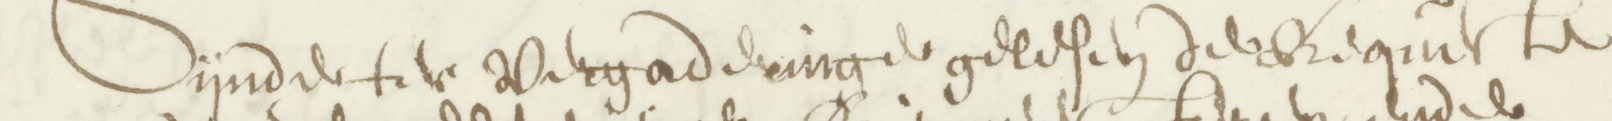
Sijnde ter Vergaderinge gelesen de Requeste
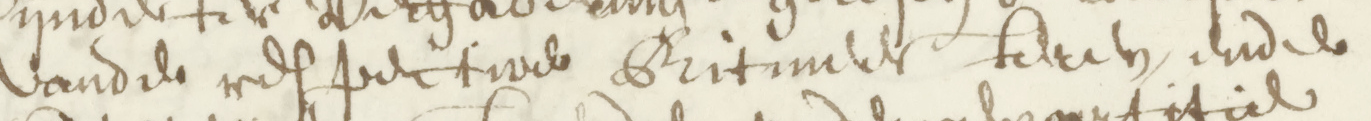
vande respective Ritmeesteren, ende
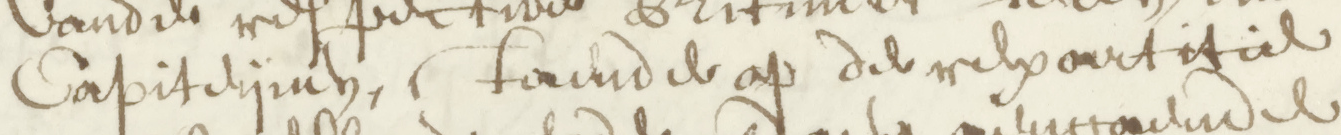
Capiteijnen, staende op de repartitie
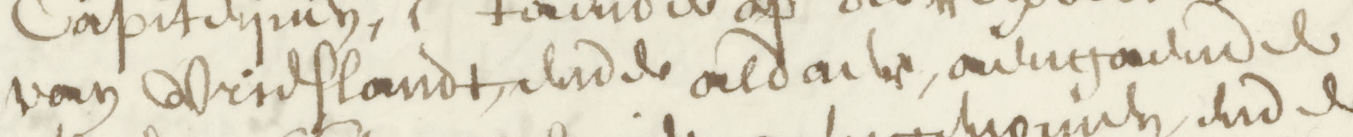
van Vrieslandt, ende aldaer, aengaende
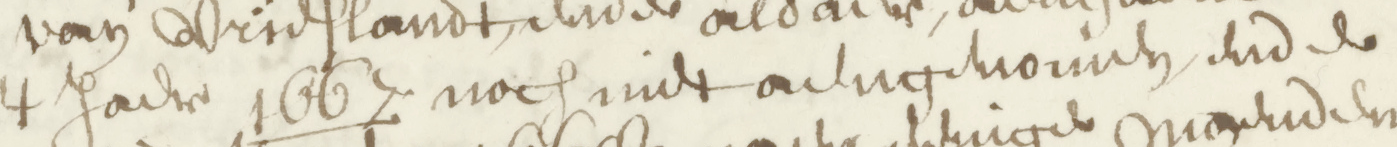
4 Jaer 1667 noch niet aengenomen, ende
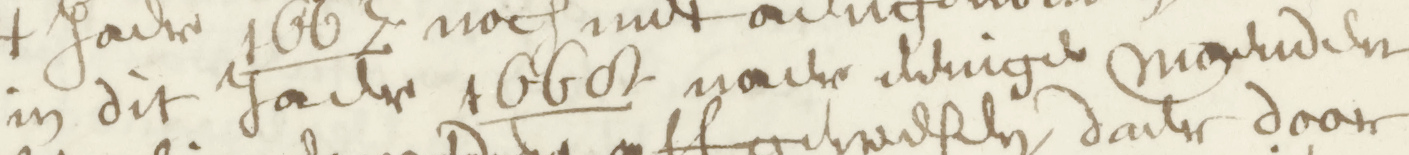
in dit Jaer 1668 naer eenige maenden
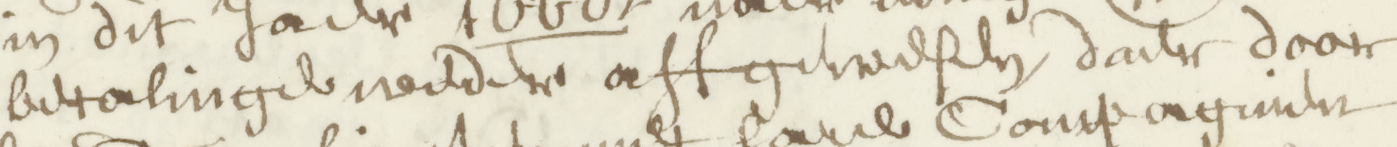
betalinge weder affgewesen, daer door
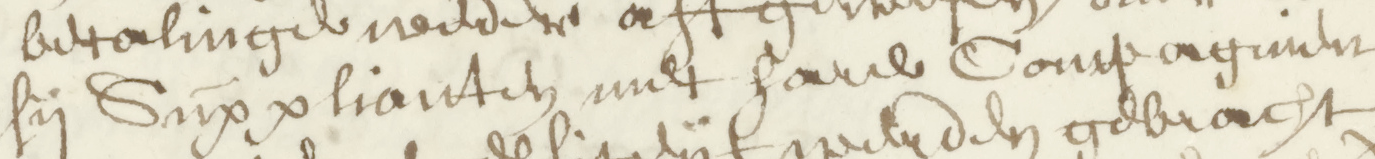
sij Supplianten met hare Compagnien
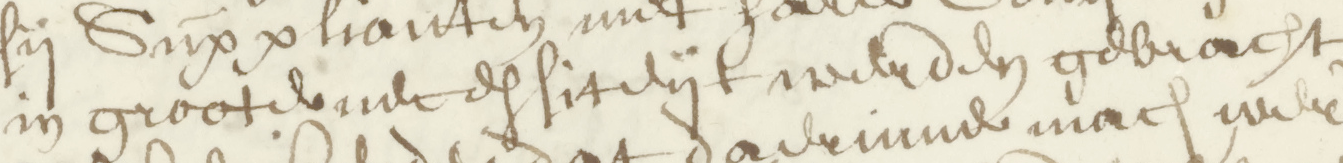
in groote necessiteijt werden gebracht
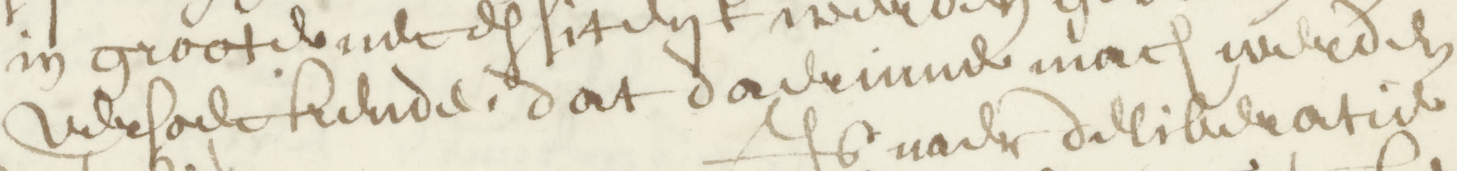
versoeckende, dat daerinne mach werden
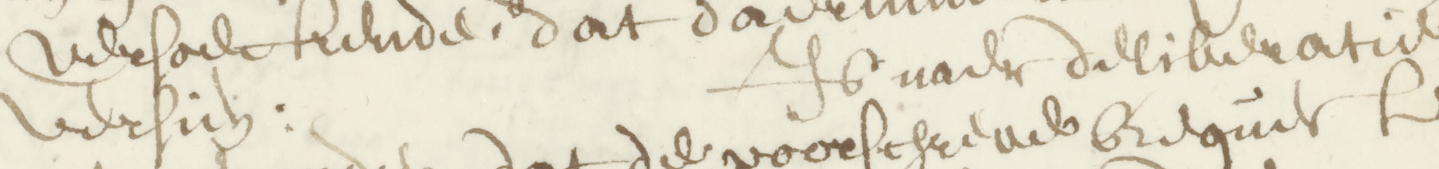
versien: Is naer deliberatie
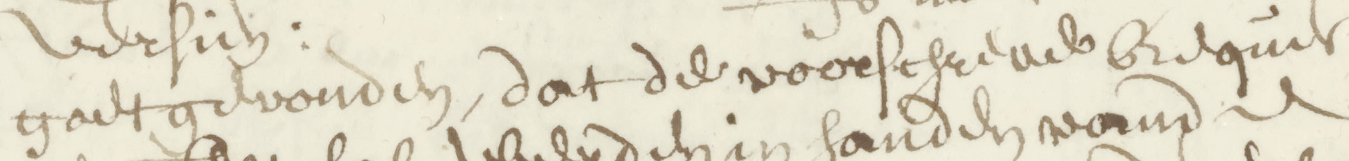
goetgevonden, dat de voorschreve Requeste
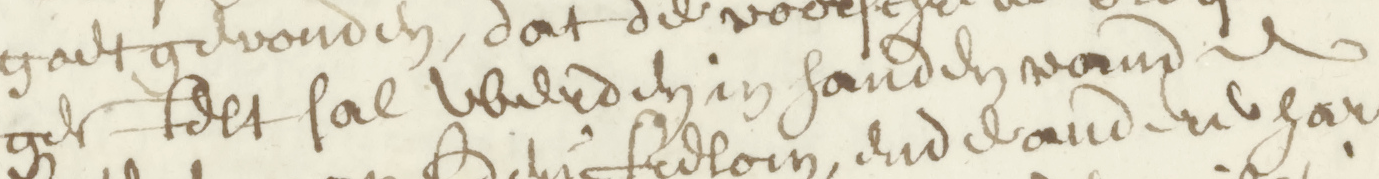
gestelt sal werden in handen vande
